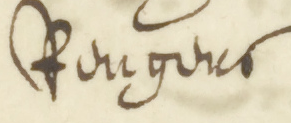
Rengers
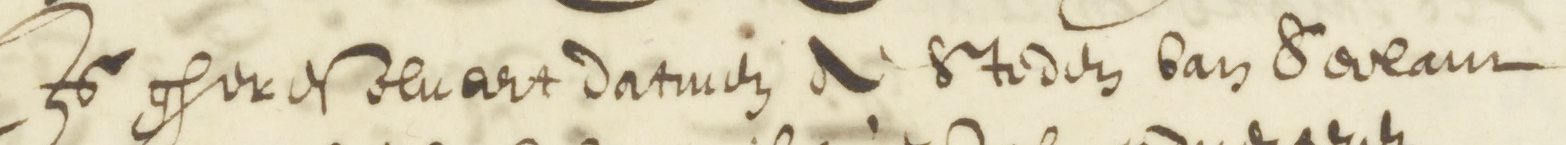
Is gheresolveert datmen de steden van Seelant
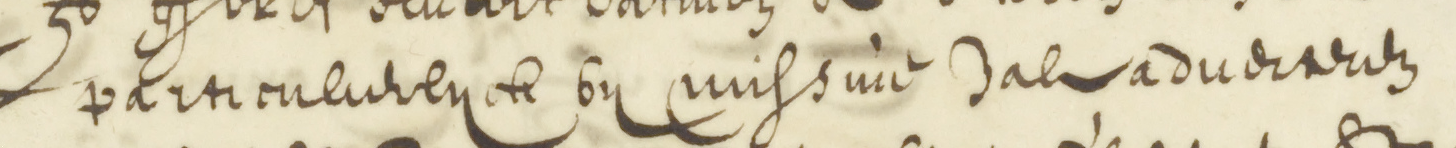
particulierlyck by missiue zal aduerteren
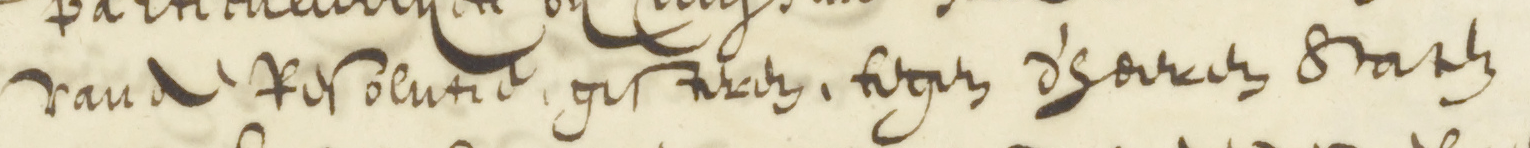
vande Resolutie, gisteren, tegen d‛heeren Staten
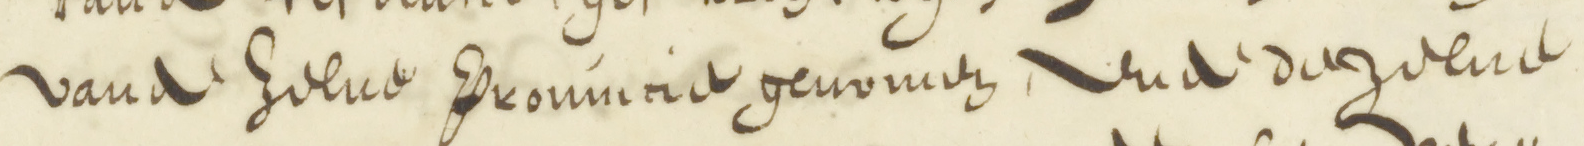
vande zelue Provincie genomen, ende dezelue
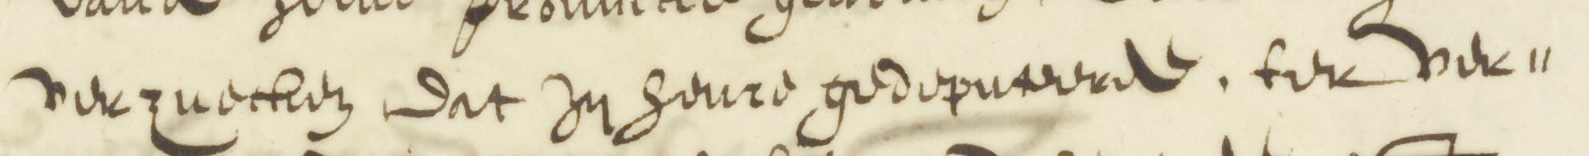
verzuecken, dat zy heure gedeputeerde, ter ver‟
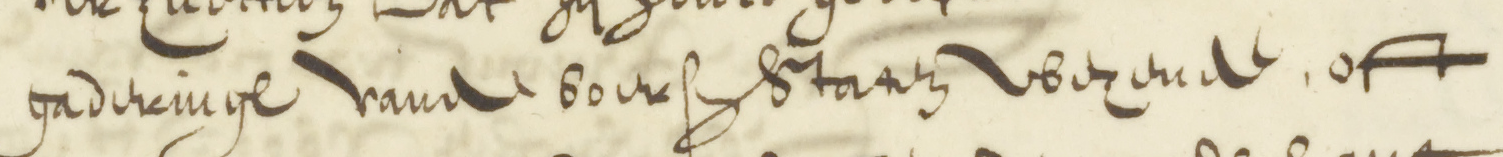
gaderinge vande voers Staten wezende, off
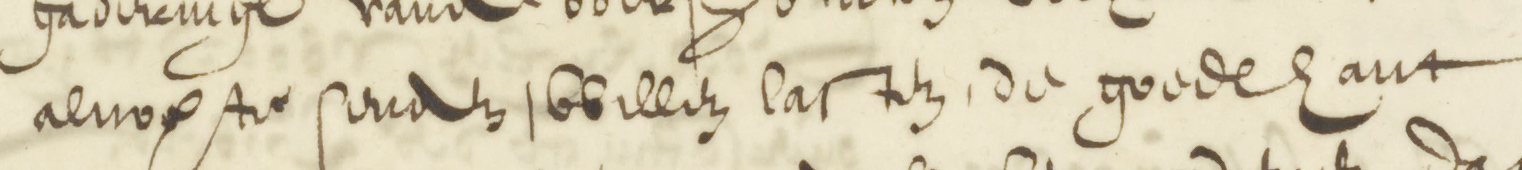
alnoch te senden, willen laten, de goede hant
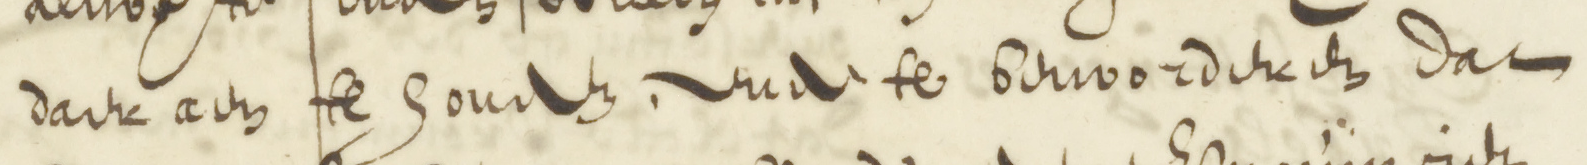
daer aen te houden, ende te beuoorderen dat
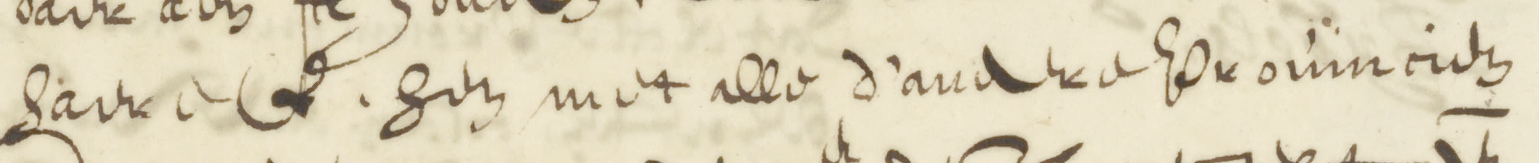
haer E. hen met alle d‛andere Prouincien
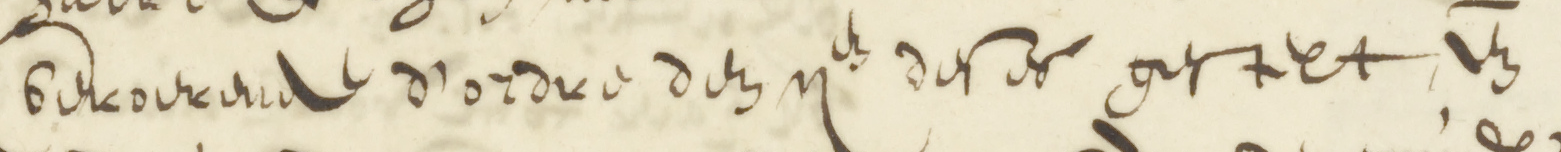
beroerende d‛ordre den IIen deses gestelt, en
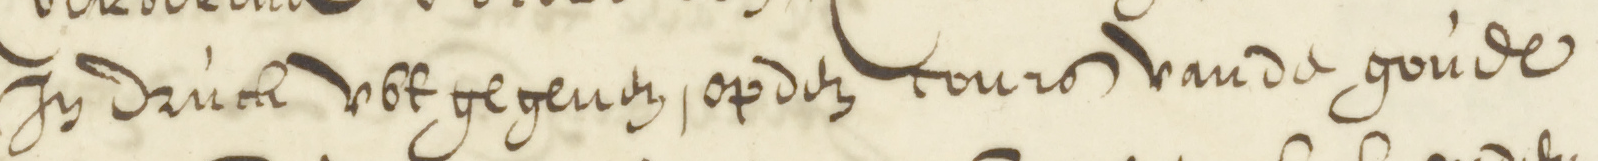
In druck wtgegeven, opden cours vande goude
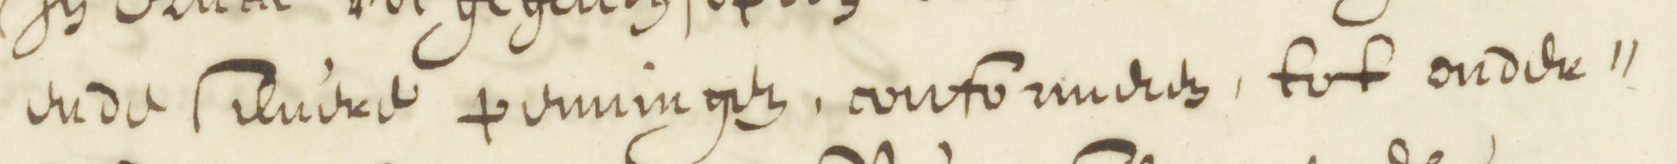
ende siluere penningen, conformeren tot onder„
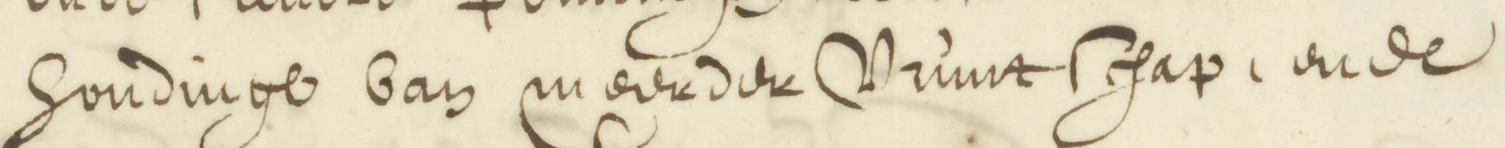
houdinge van meerdere Vruntschap, ende
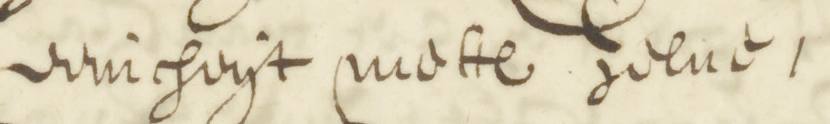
eenicheyt mette zelue
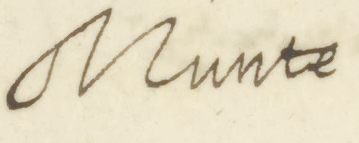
Munte
